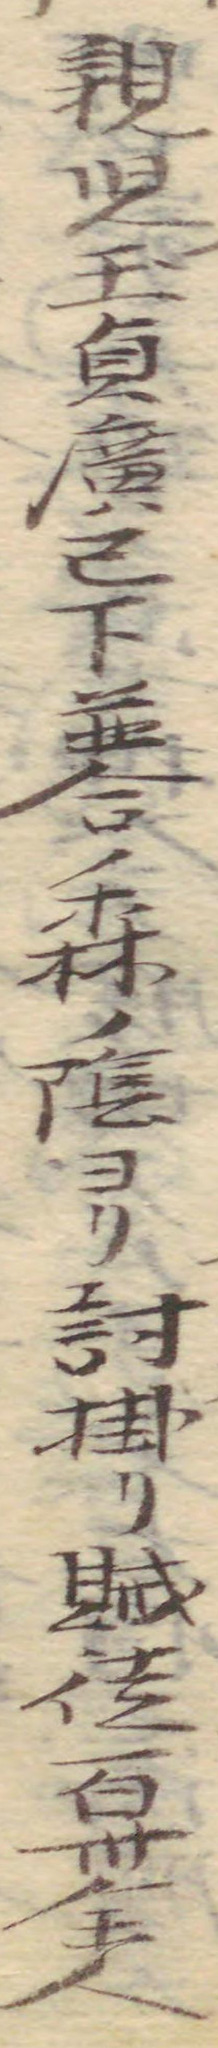親児玉貞広已下並合ノ森ノ陰ヨリ討掛リ賊徒百卅余人
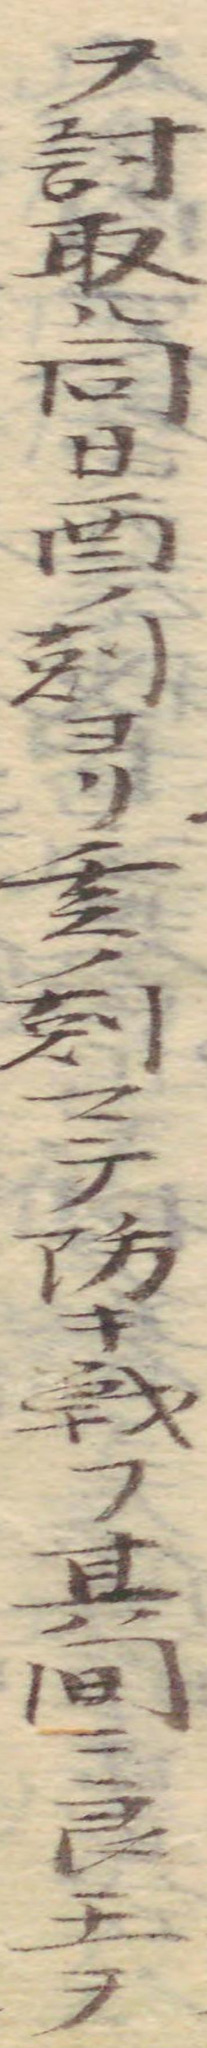ヲ討取ル同日酉ノ刻ヨリ亥ノ刻マテ防キ戦フ其間ニ良王ヲ
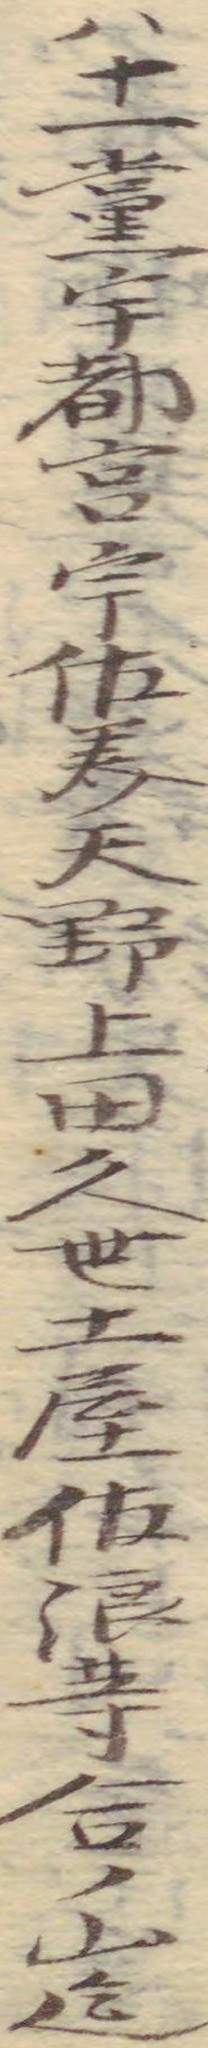ハ十一党宇都宮宇佐美天野上田久世土屋佐浪等合ノ山迄
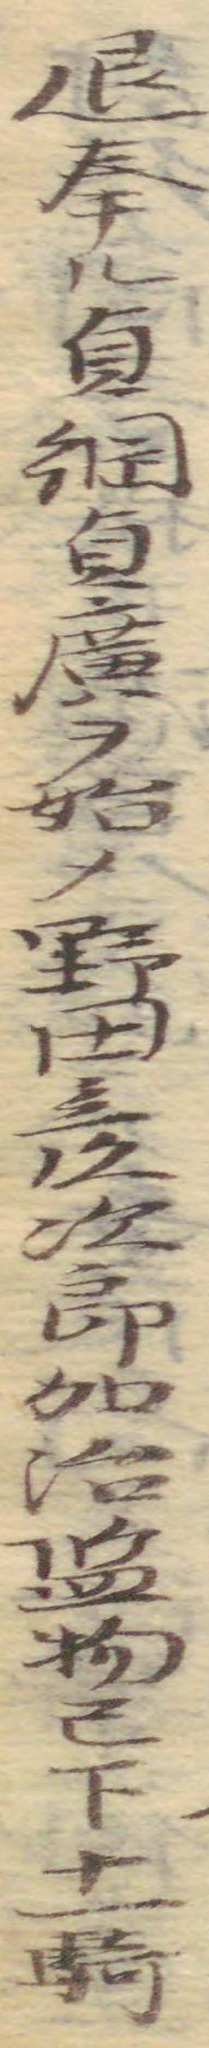退奉ル貞綱貞広ヲ始メ野田彦次郎加治監物已下十一騎

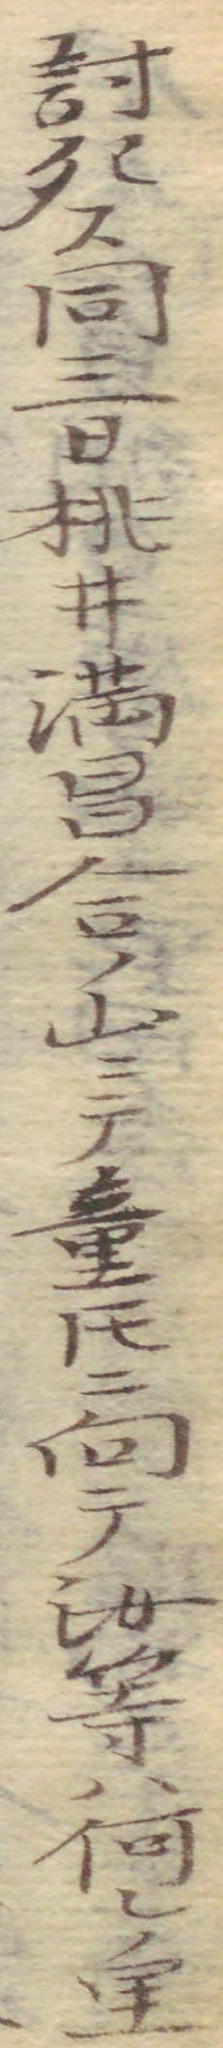討死ス同三日桃井満昌合ノ山ニテ童トモニ向テ汝等ハ何レノ里
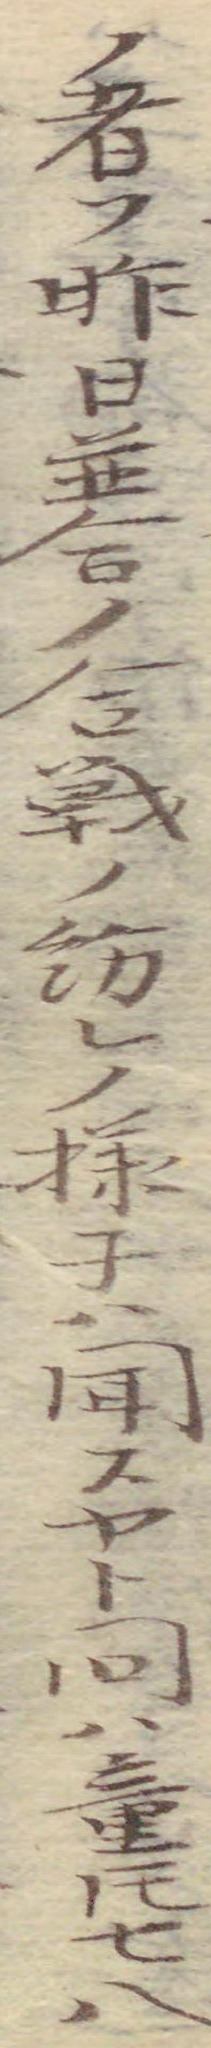ノ者ソ昨日並合ノ合戦ノ紛レノ様子ハ聞スヤト問ハ童トモ七八
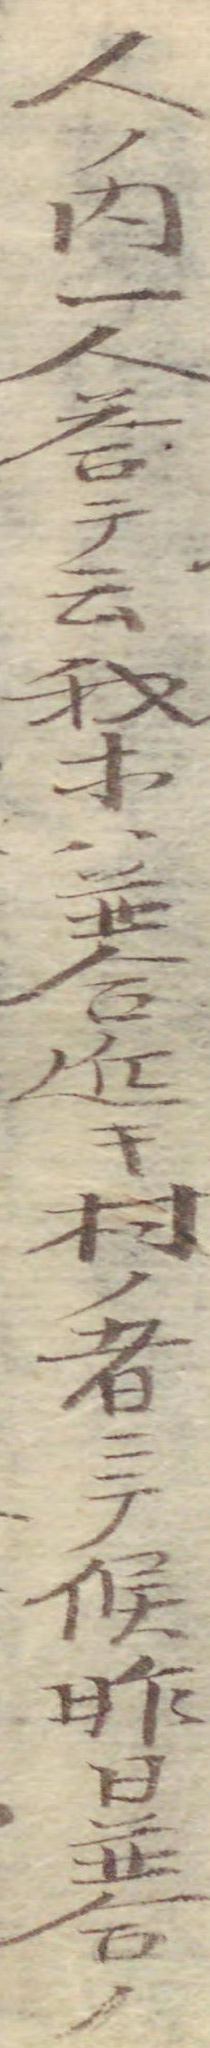人ノ内一人答テ云我等ハ並合近キ村ノ者ニテ候昨日並合ノ
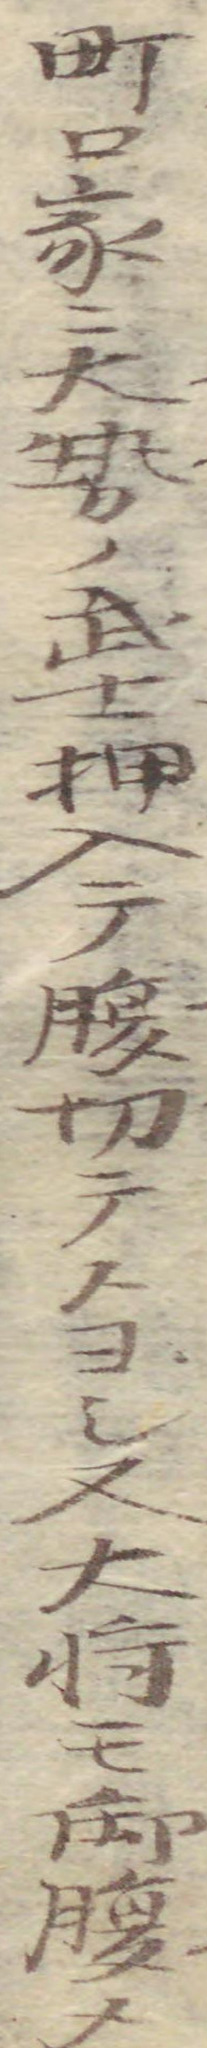町口家ニ大勢ノ武士押入テ腹切テ候ヨシ又大将モ御腹メ
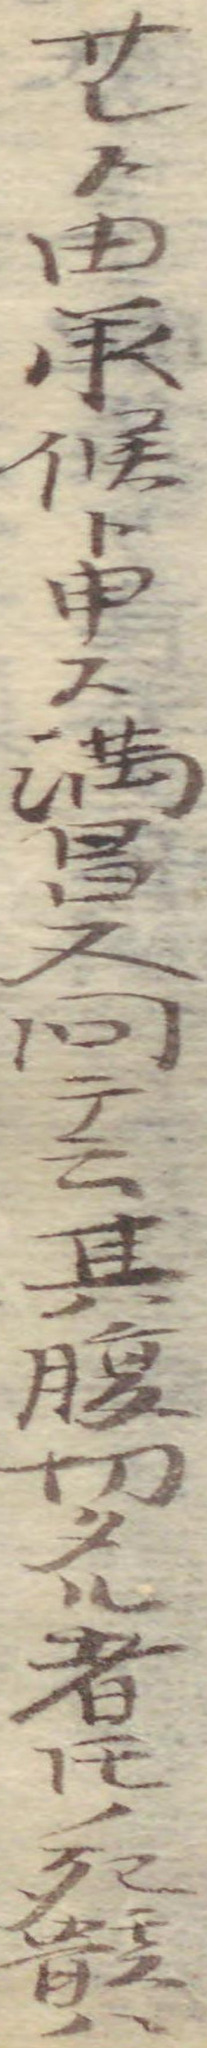サレ候由承候ト申ス満昌又問テ云其腹切タル者トモノ死骸ハ
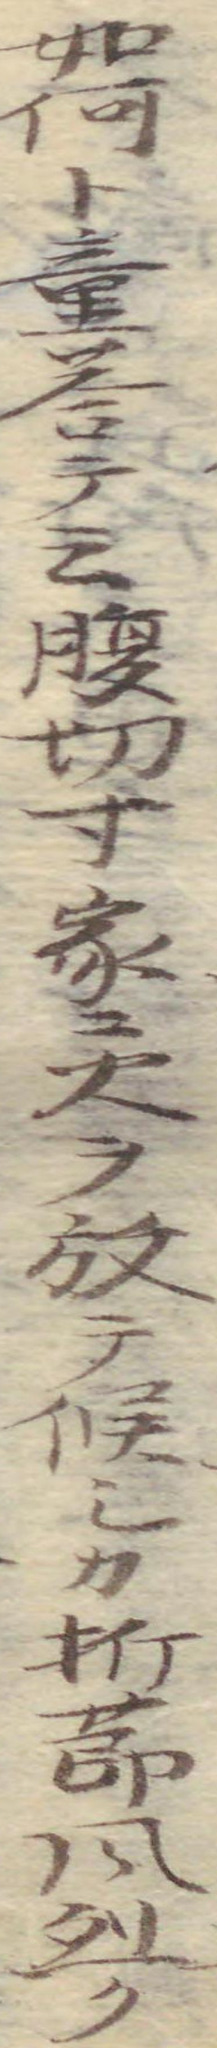如何ト童答テ云腹切寸家ニ火ヲ放テ候シカ折節風烈ク
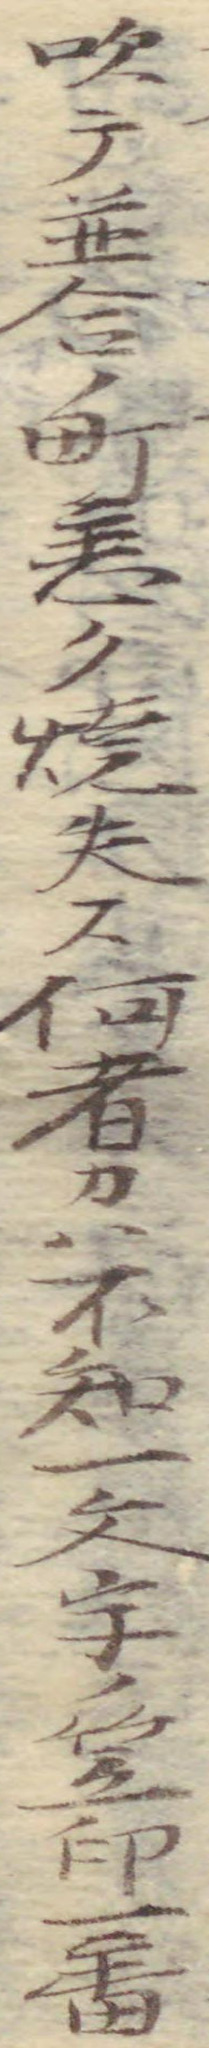吹テ並合ノ町悉ク消失ス何者カハ不知一文字ノ笠印一番
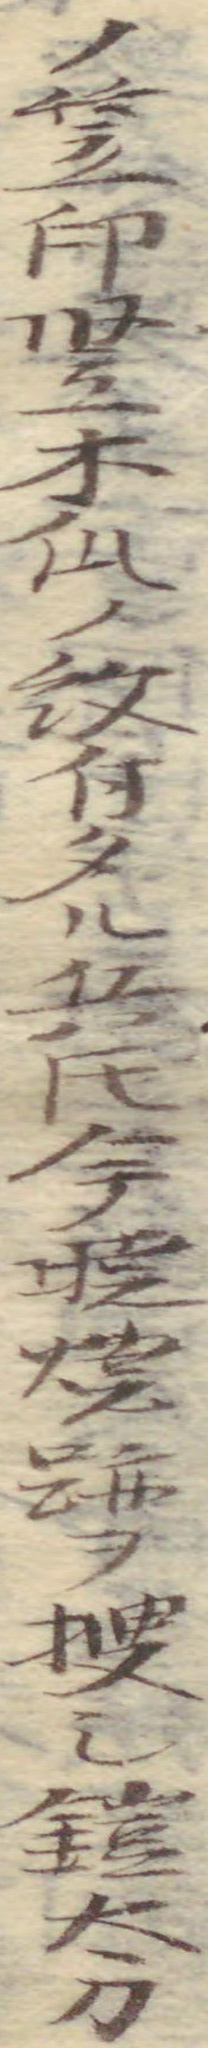ノ笠印竪木瓜ノ紋付タル兵トモ今暁焼跡ヲ捜シ鎧太刀
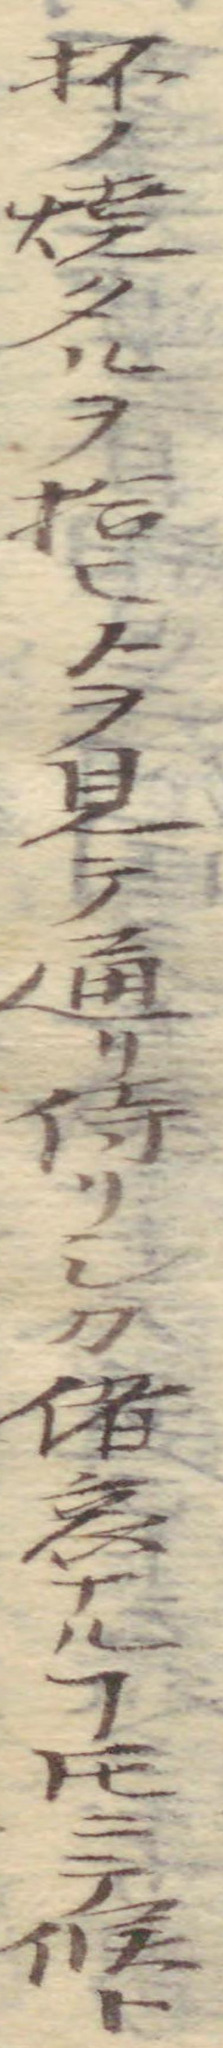抔ノ焼タルヲ拾ヒ候ヲ見テ通リ侍リシカ偖哀ナルコトトモニテ候ト
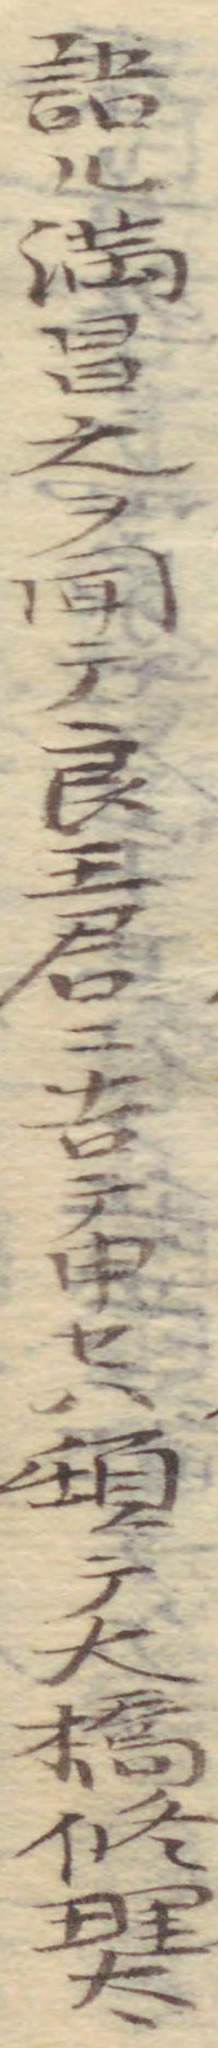語ル満昌之ヲ聞テ良王君ニ告テ申セハ頓テ大橋修理太
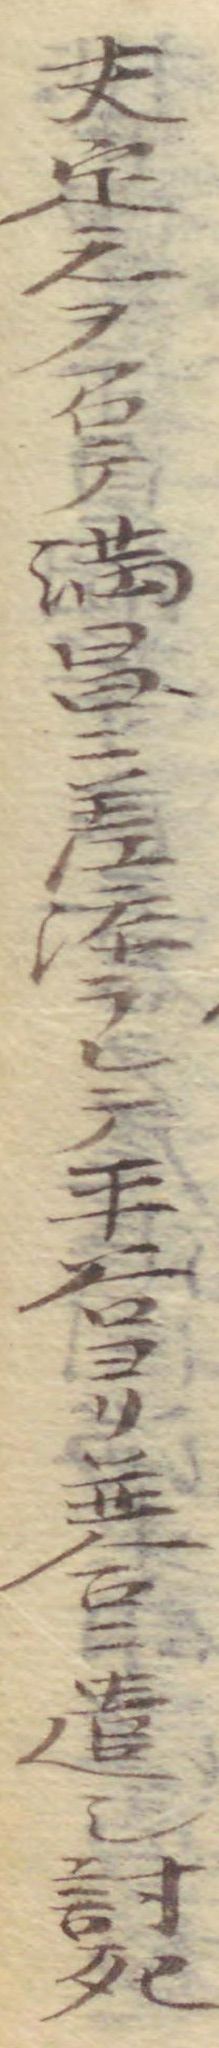夫定元ヲ召テ満昌ニ差添ラレテ平谷ヨリ並合ニ遣シ討死
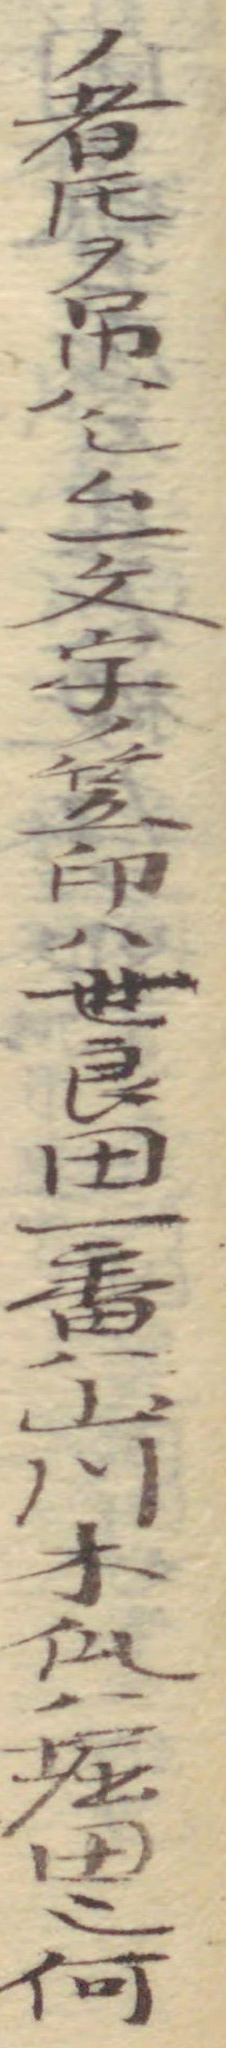ノ者トモ吊ハシム一文字ノ笠印ハ世良田一番ハ山川木瓜ハ堀田也何
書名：鶯宿雑記. 巻199-200
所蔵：国立国会図書館 National Diet Library, JAPAN
